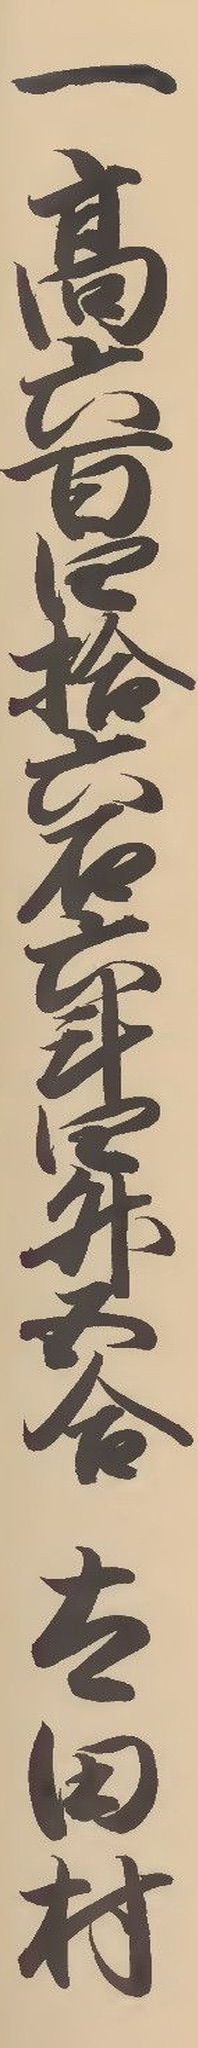一高六百四拾六石六斗四升五合太田村
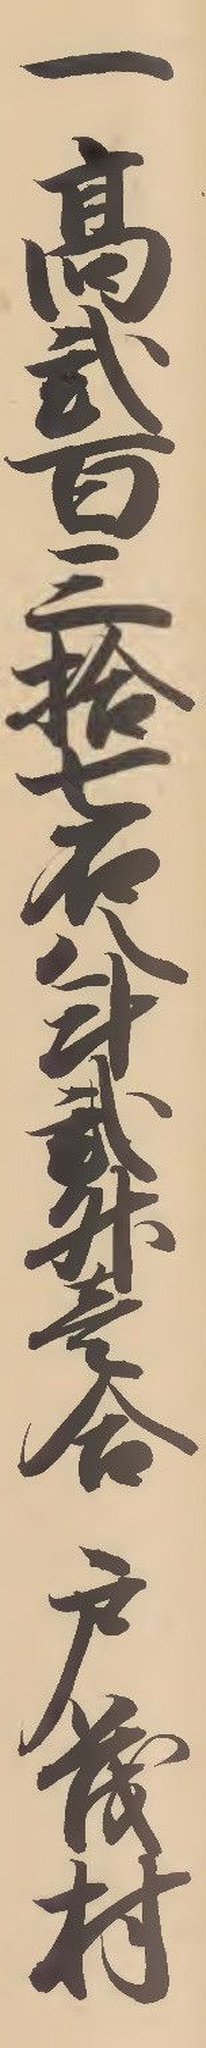一高弐百三拾七石八斗弐升壱合戸茂村
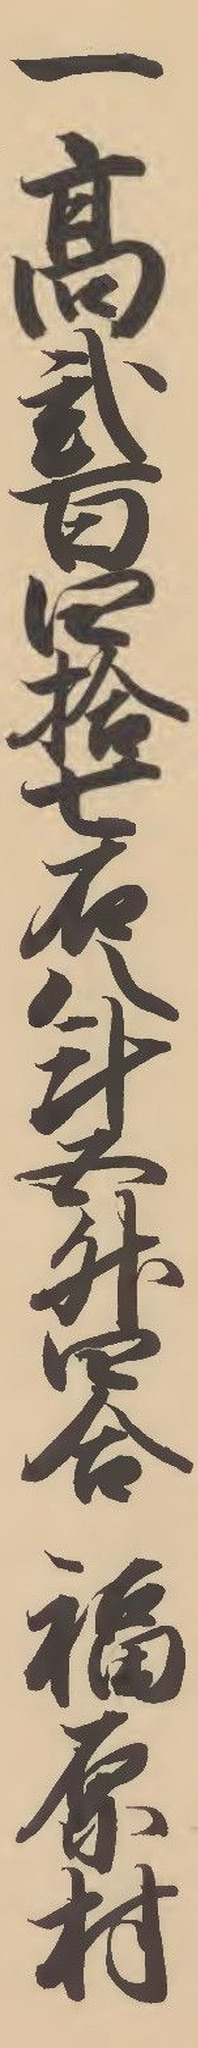一高弐百四拾七石八斗五升四合福原村
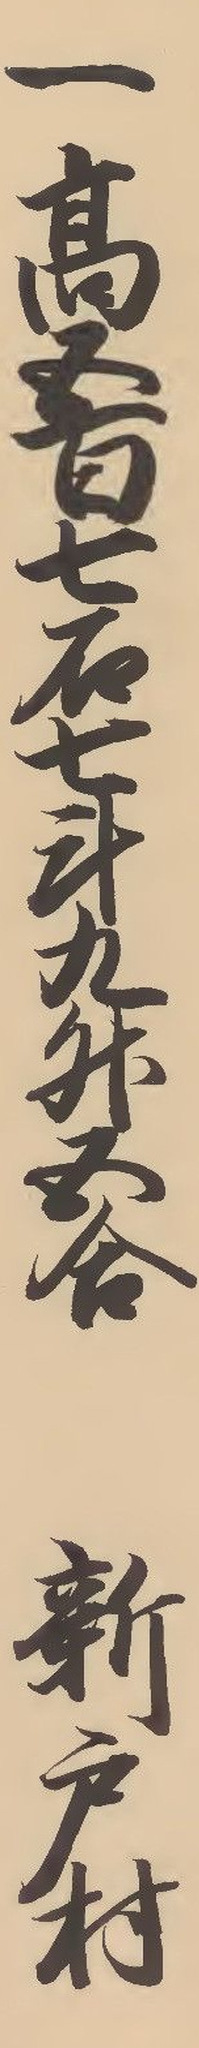一高五百七石七斗九升五合新戸村
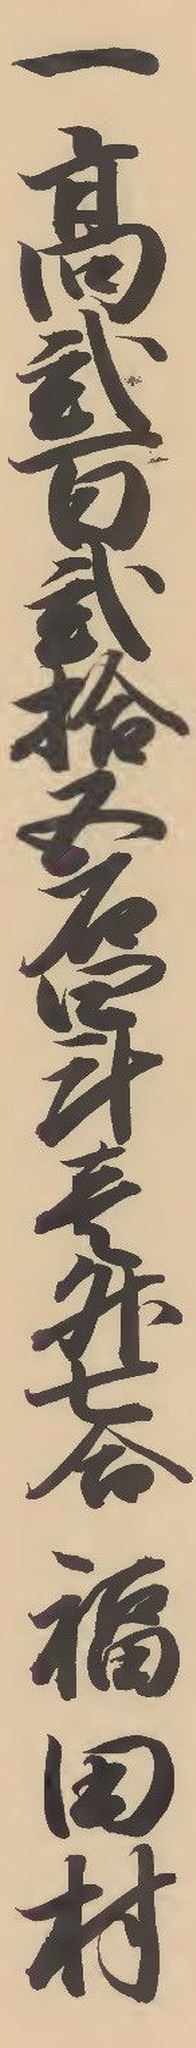一高弐百弐拾五石四斗壱升七合福田村

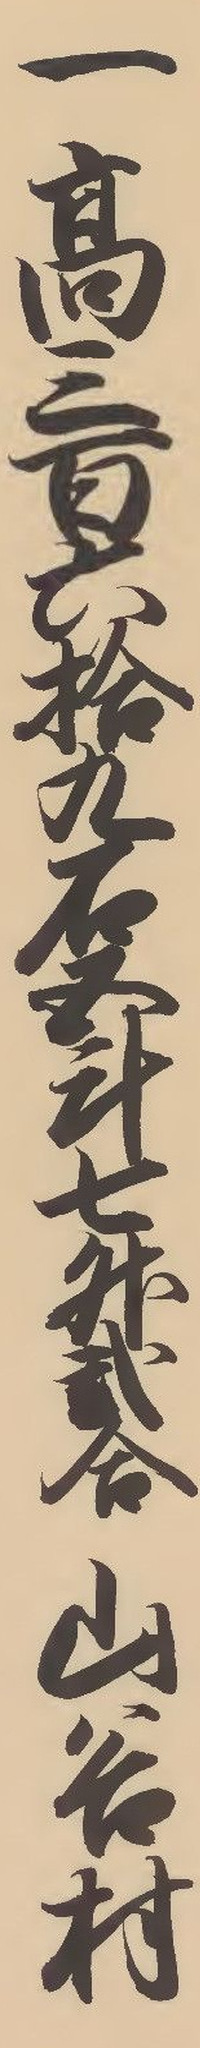一高三百六拾九石五斗七升弐合山谷村
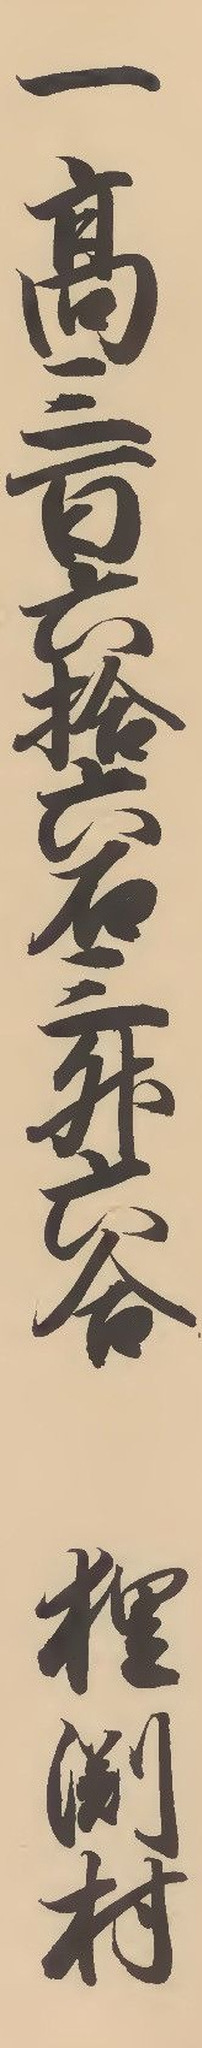一高三百六拾六石三升六合狸淵村
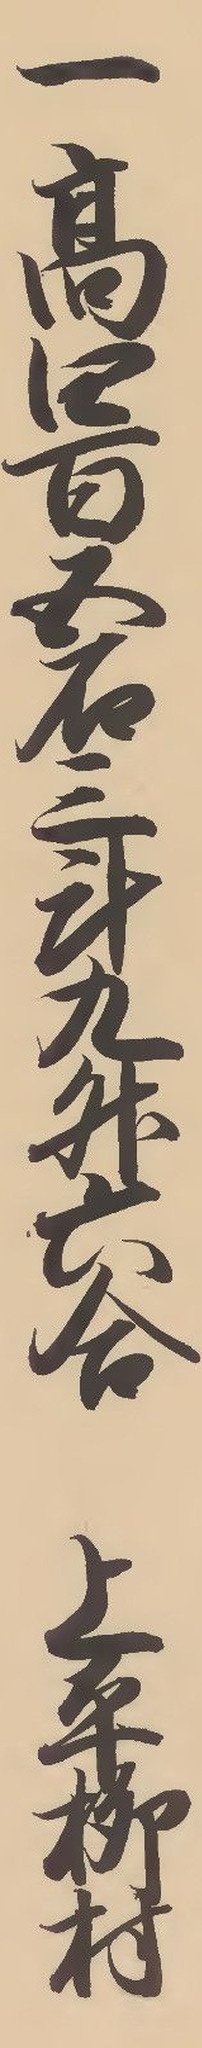一高四百五石三斗九升六合上平柳村
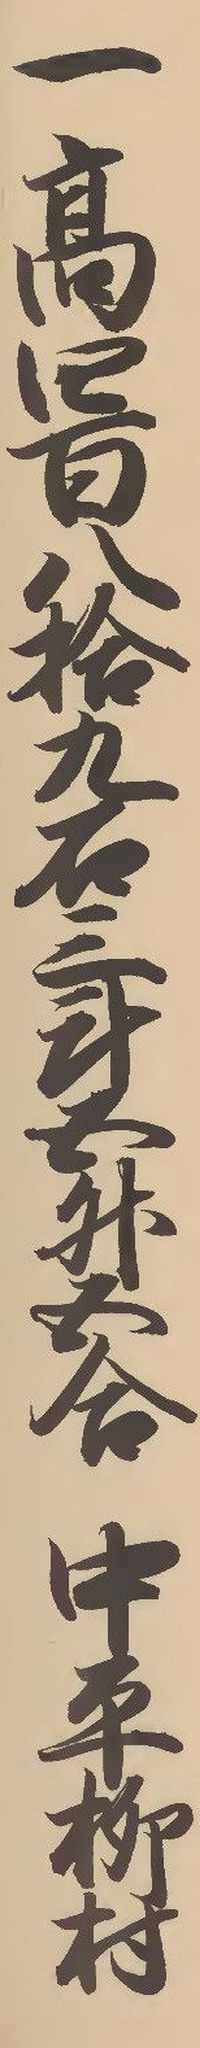一高四百八拾九石三斗五升五合中平柳村
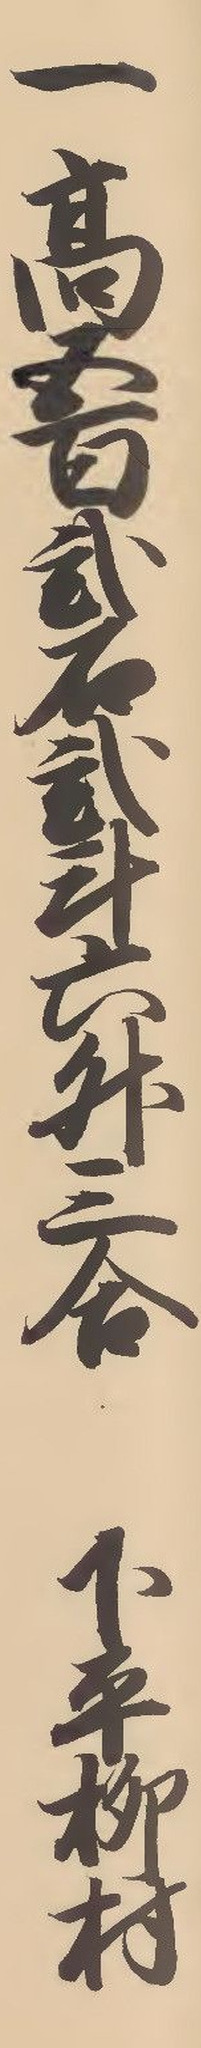一高五百弐石弐斗六升三合下平柳村
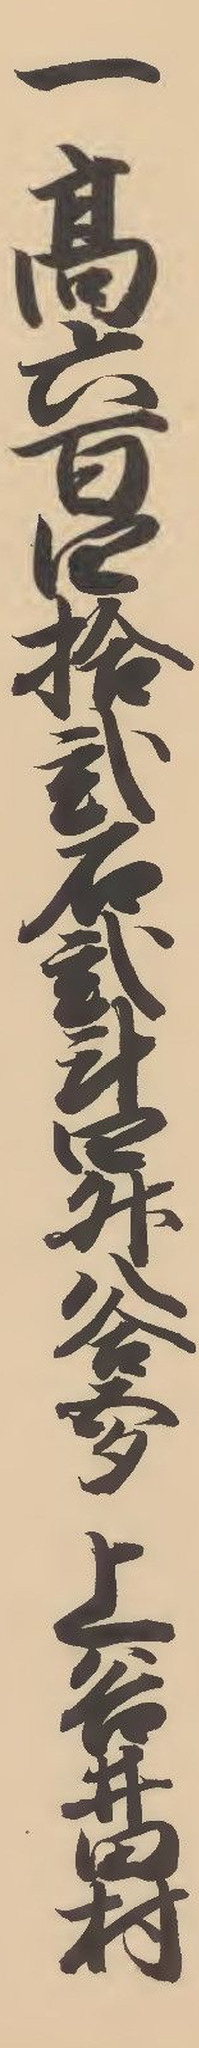一高六百四拾弐石弐斗四升八合五勺上谷井田村
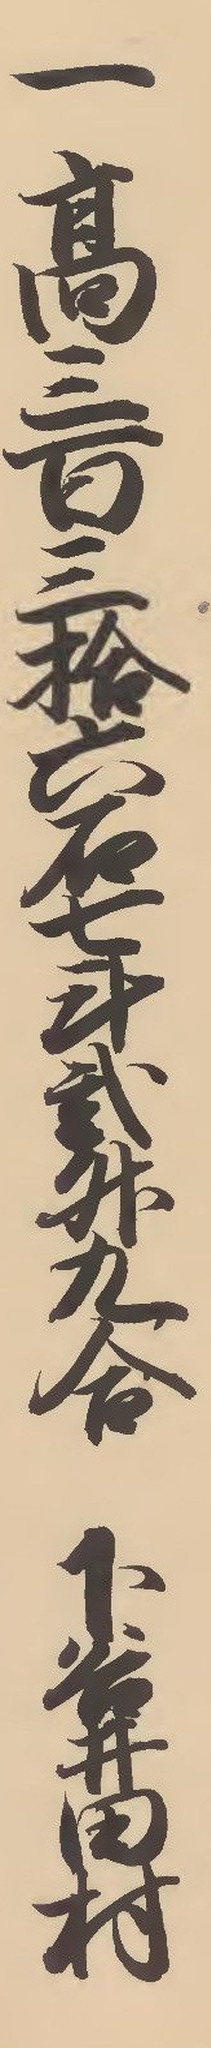一高三百三拾六石七斗弐升九合下谷井田村
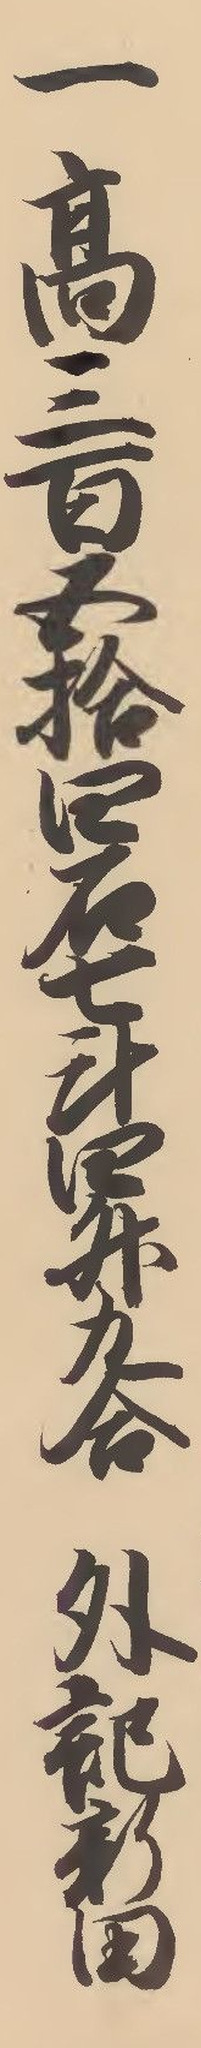一高三百五拾四石七斗四升九合外記新田

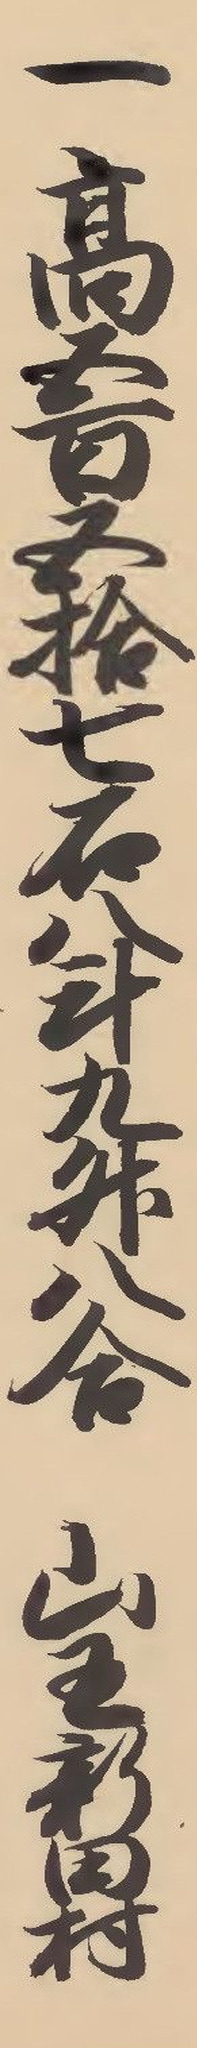一高五百五拾七石八斗九升八合山王新田村
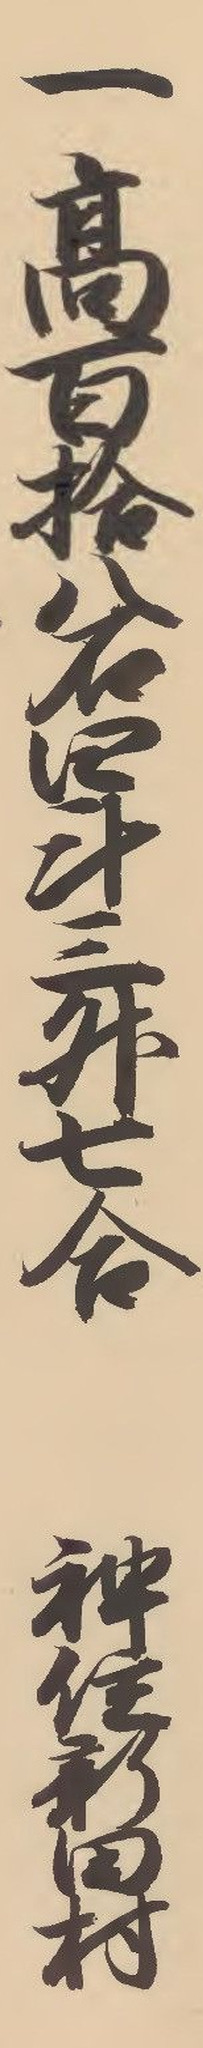一高百拾八石四斗三升七合神住新田村
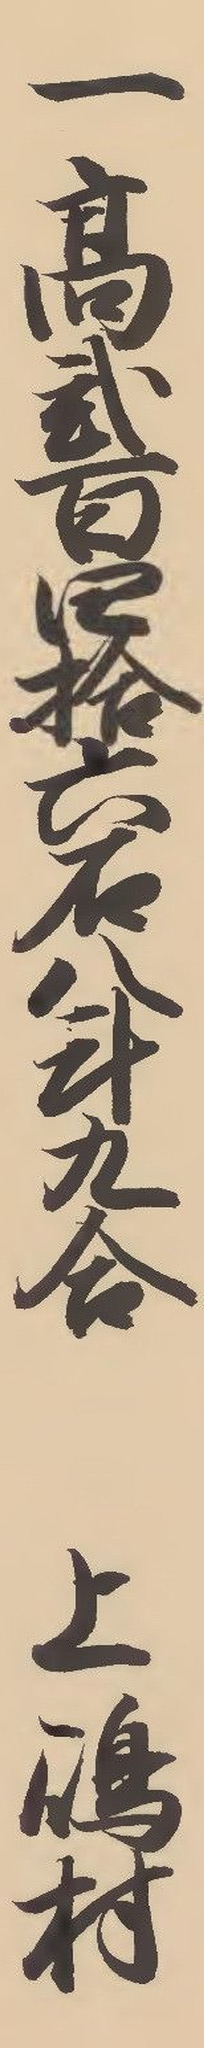一高弐百四拾六石八斗九合上島村
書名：常陸国郷帳
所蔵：国立公文書館 National Archives of Japan
